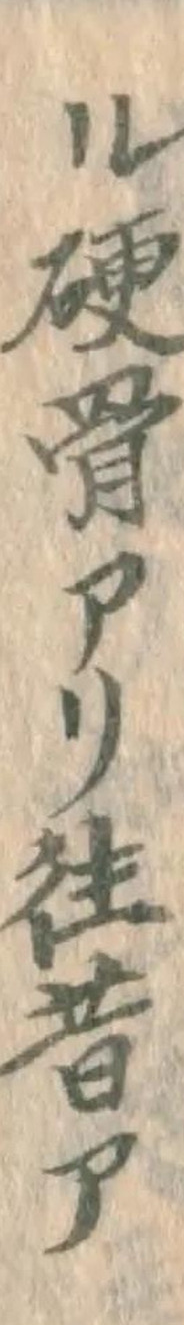ル硬骨アリ往昔ア
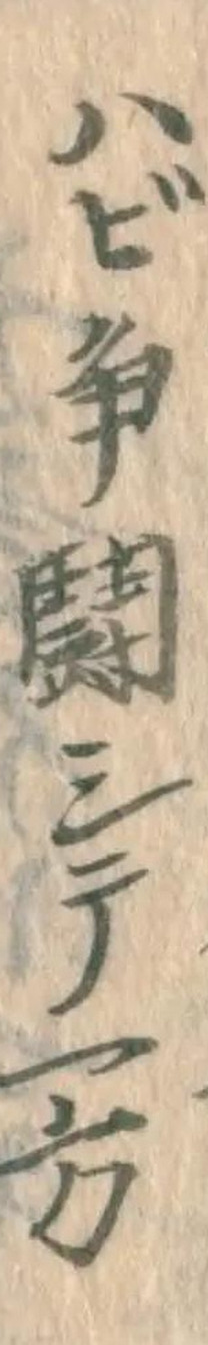ハビ争闘シテ一方
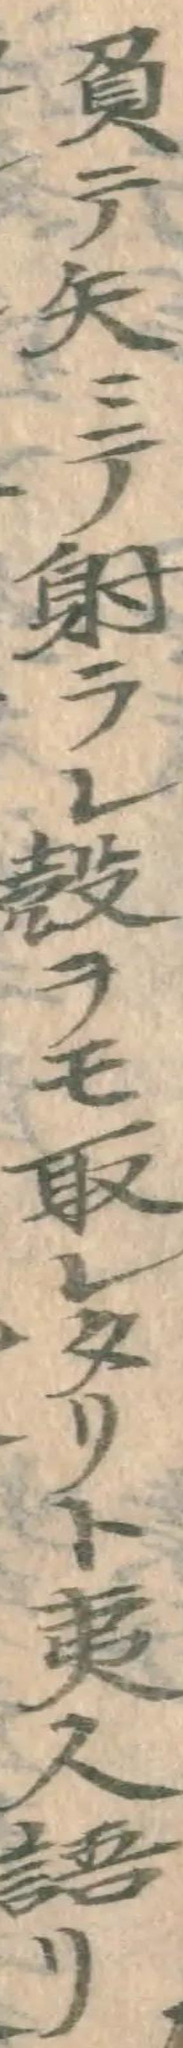負テ矢ニテ射ラレ殻ヲモ取レタリト夷人語リ
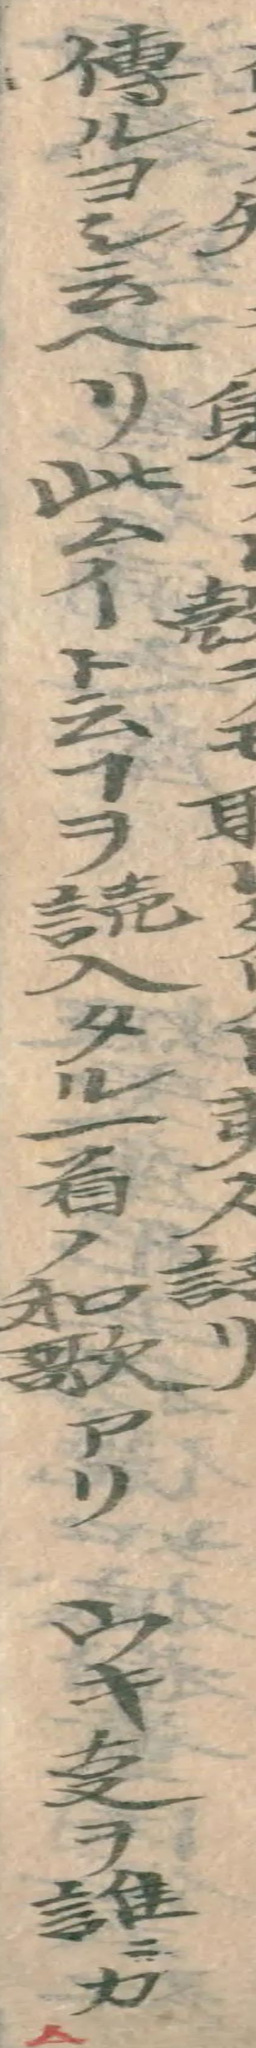伝ルヨシ云ヘリ此ムイト云コトヲ読入タル一首ノ和歌アリウキ㕝ヲ誰ニカ△

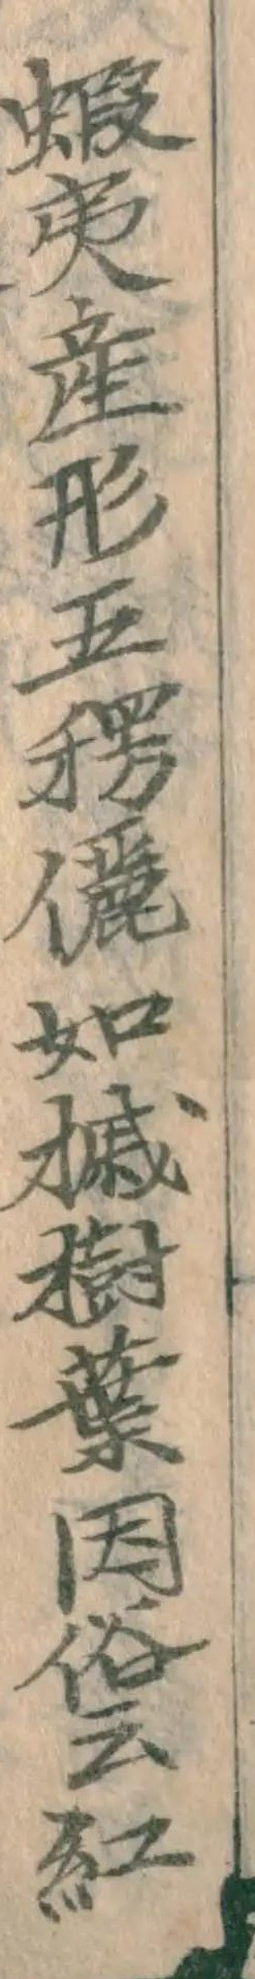蝦夷産形儷如槭樹葉因俗云紅
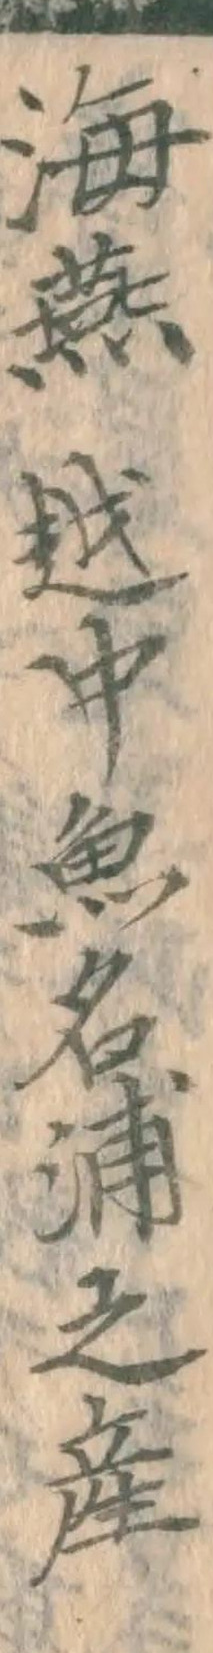海燕越中魚名浦之産
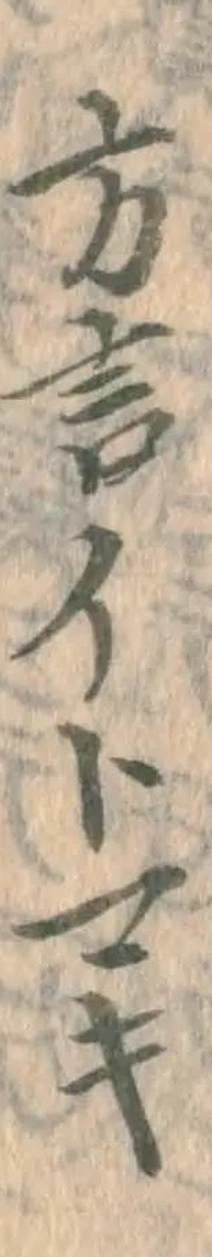方言イトマキ
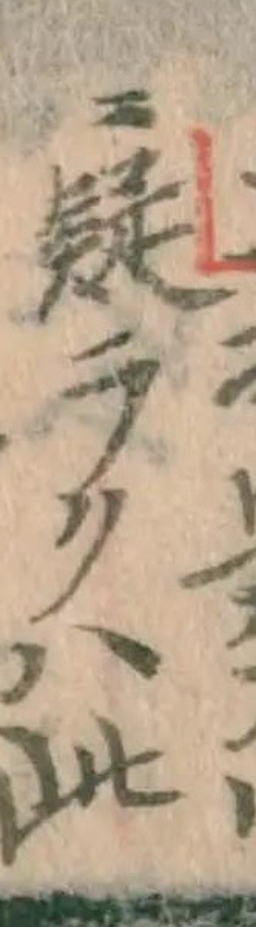ニ疑ラクハ此
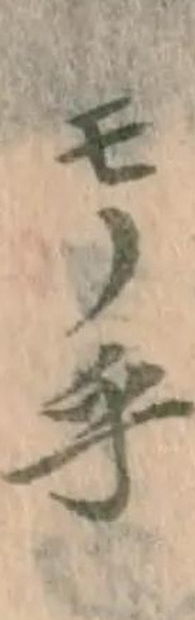モノ乎
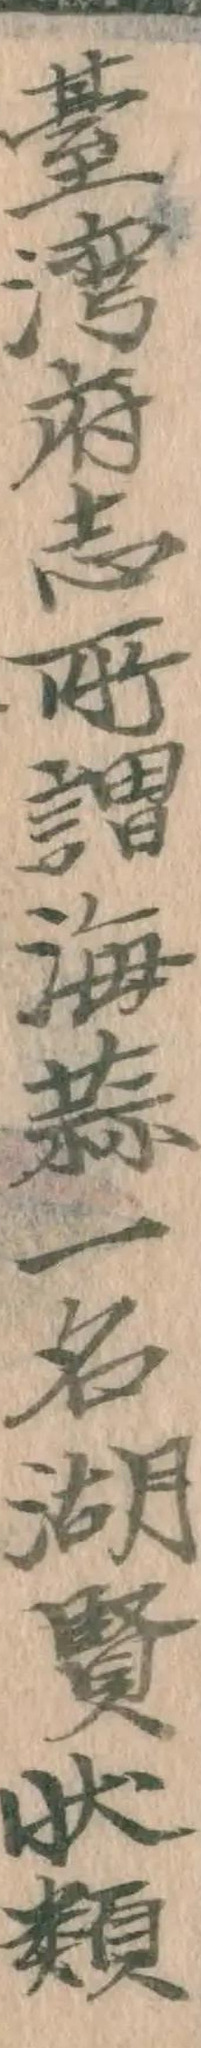台湾府志所謂海蒜一名湖賢状類
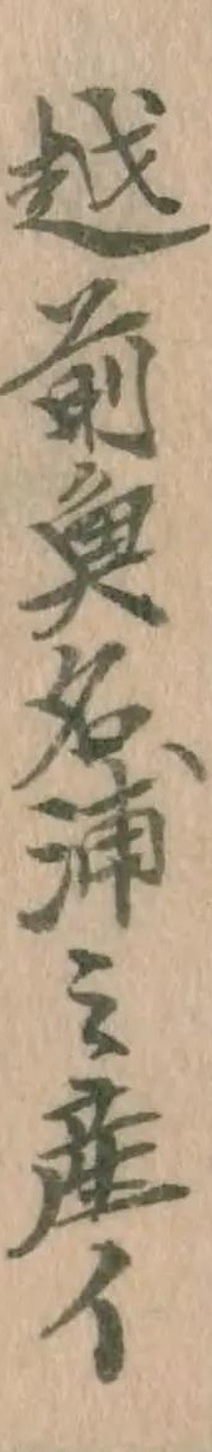越前魚名浦之産イ
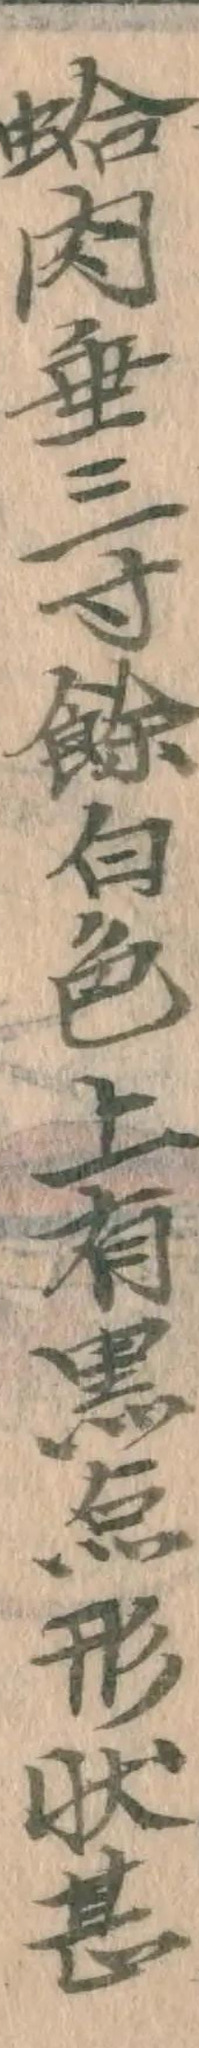蛤肉垂三寸餘白色上有黒点形状甚
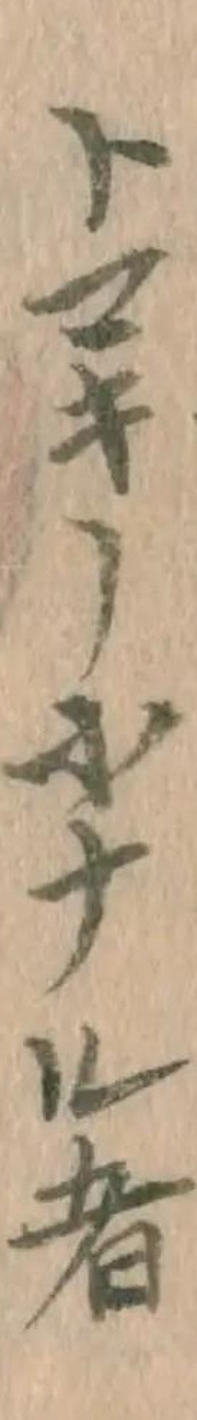トマキノ小ナル者
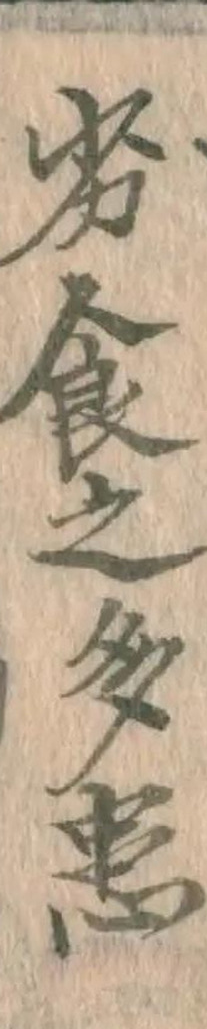劣食之多患
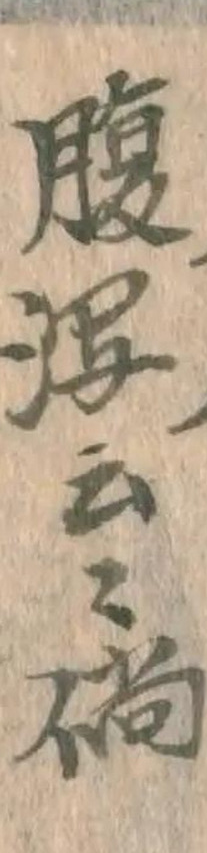腹泻云々倘
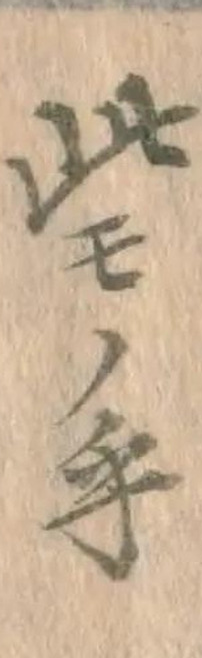此モノ乎
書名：千蟲譜 3巻. [3]
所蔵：国立国会図書館 National Diet Library, JAPAN
